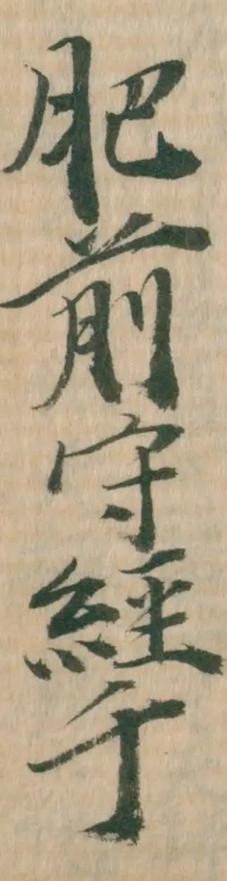肥前守経千

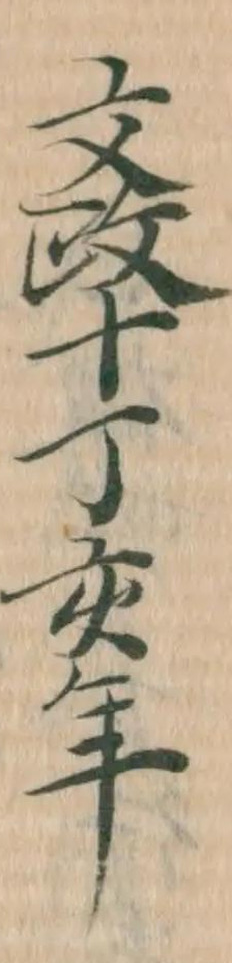文政十丁亥年
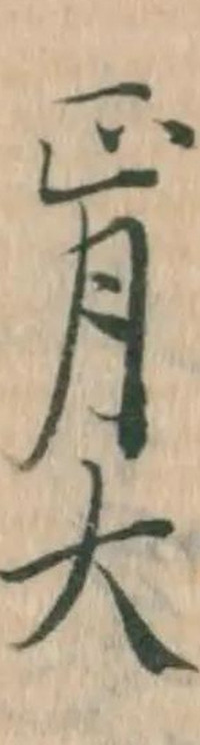正月大
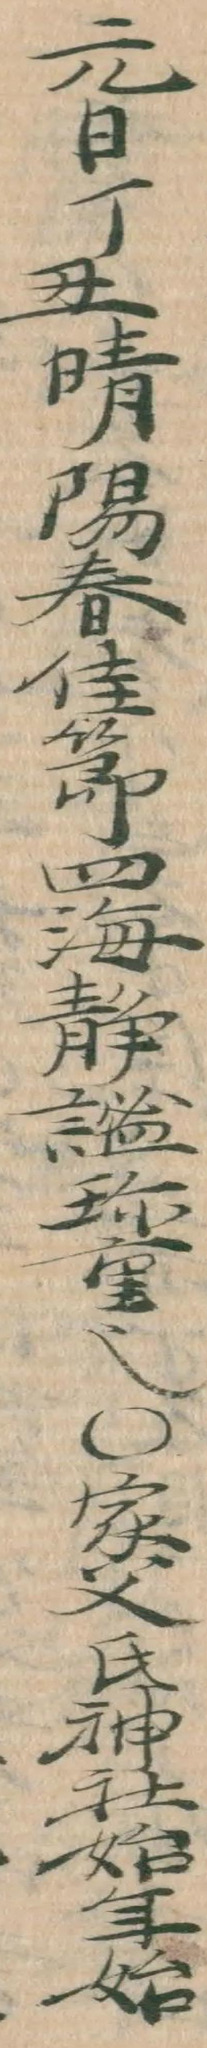元日丁丑晴陽春佳節四海静謐珍重也○家父氏神社始年始
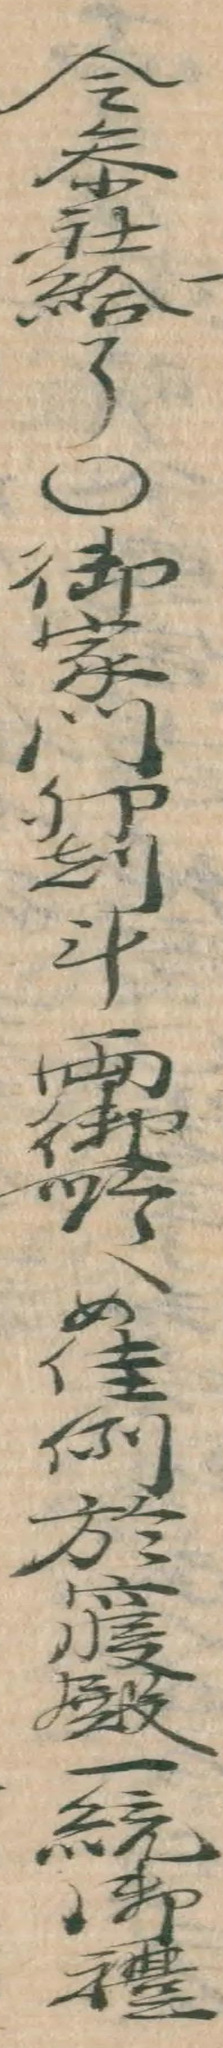令参社給了○御家門卯刻斗両御所へ如佳例於寝殿一統御禮
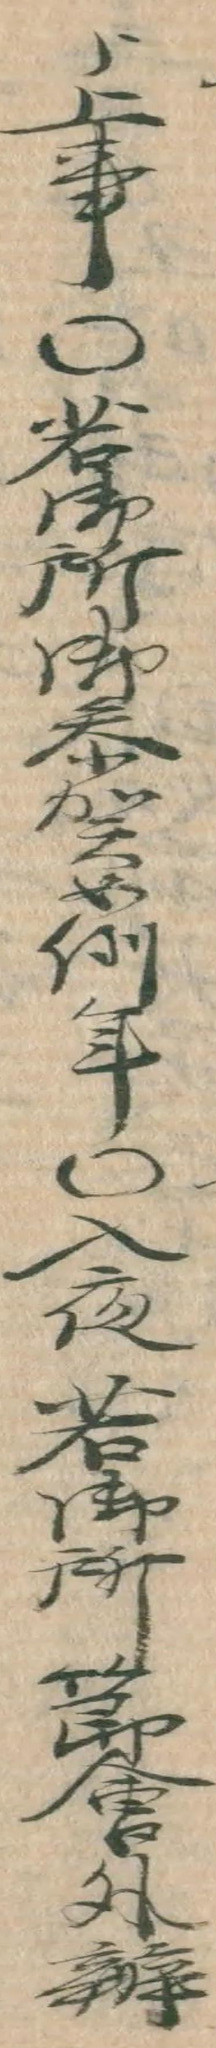申上事○若御所御泰賀如例年〇入夜若御所節會外辨
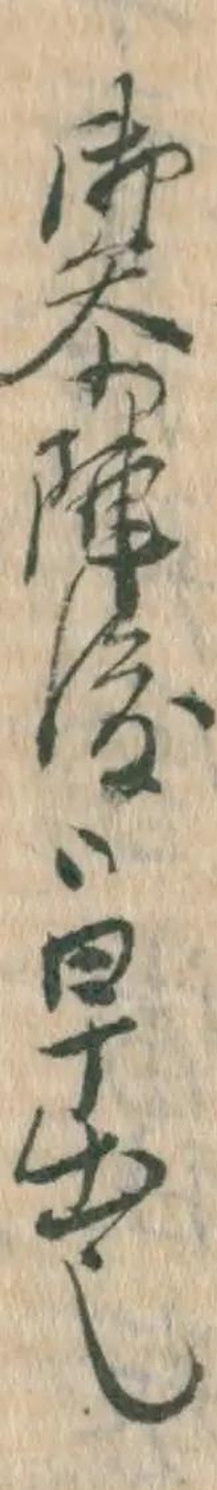御参陣後御日丁出也
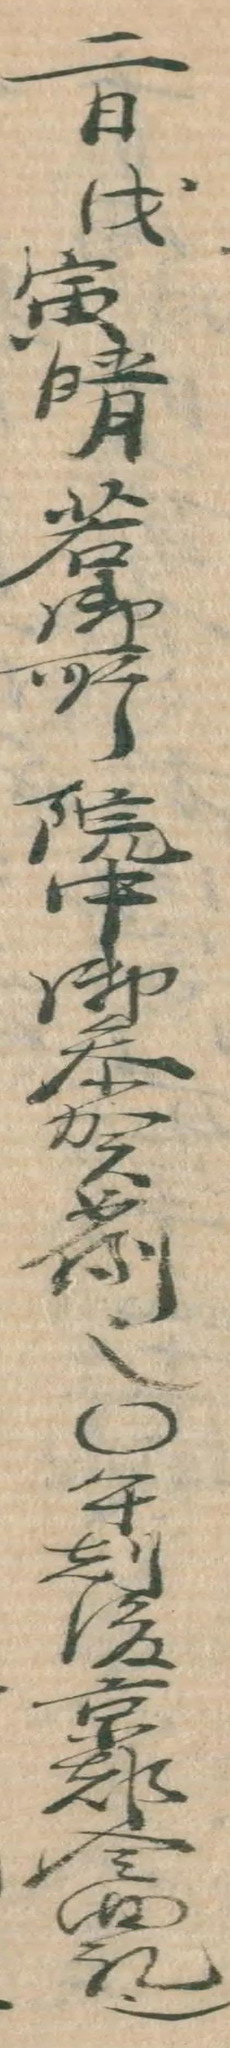二日戊寅晴若御町院中御泰賀如例也○午刻後京都令回礼也
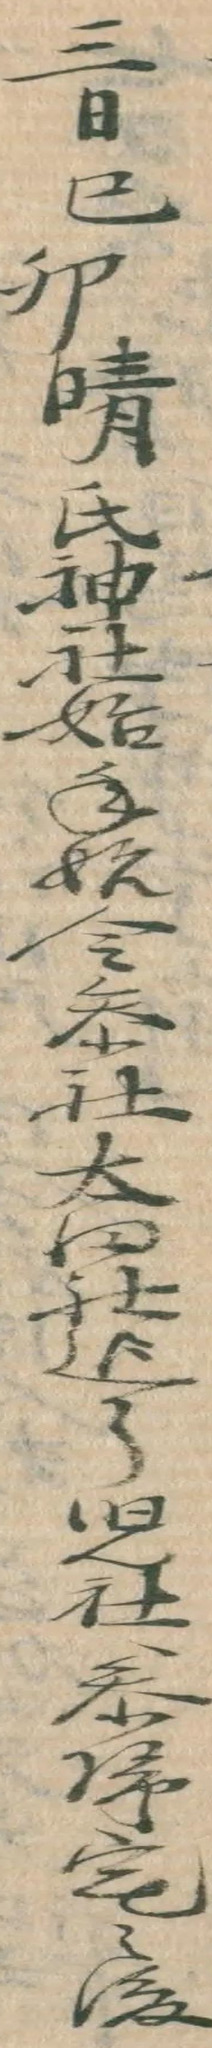三日己卯晴氏神社始年始令参社太田社迄了児社へ参帰宅之後
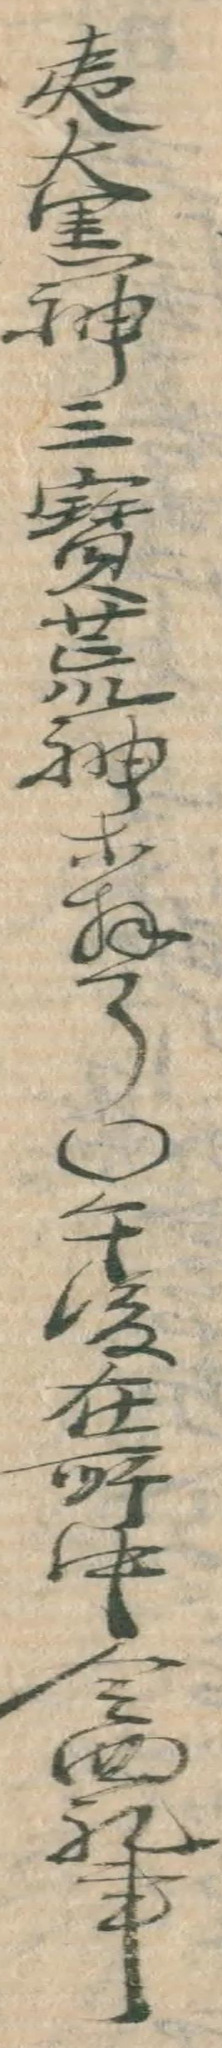夷大黒神三寶荒神等拝了○午後在所中令回礼事
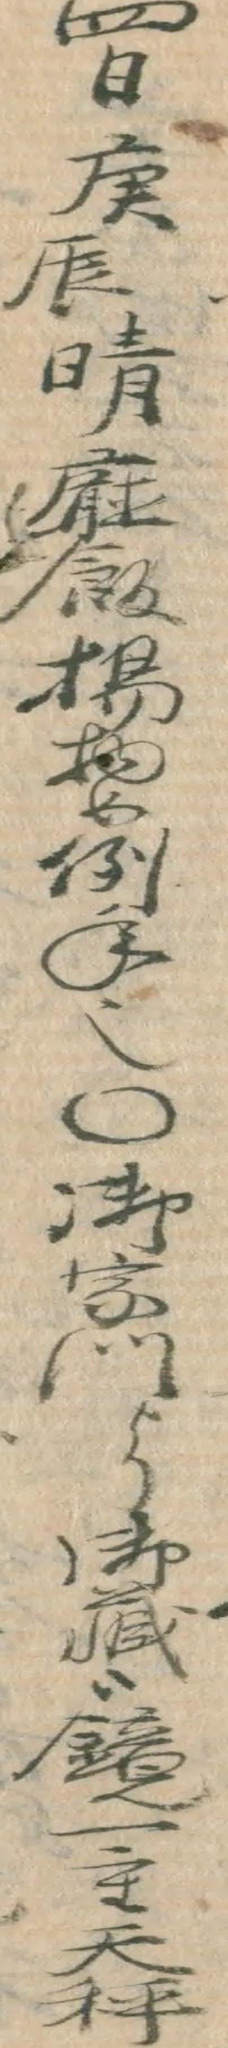四日庚辰晴廳飯揚物如例年也〇御家門より御蔵御鏡一重天秤
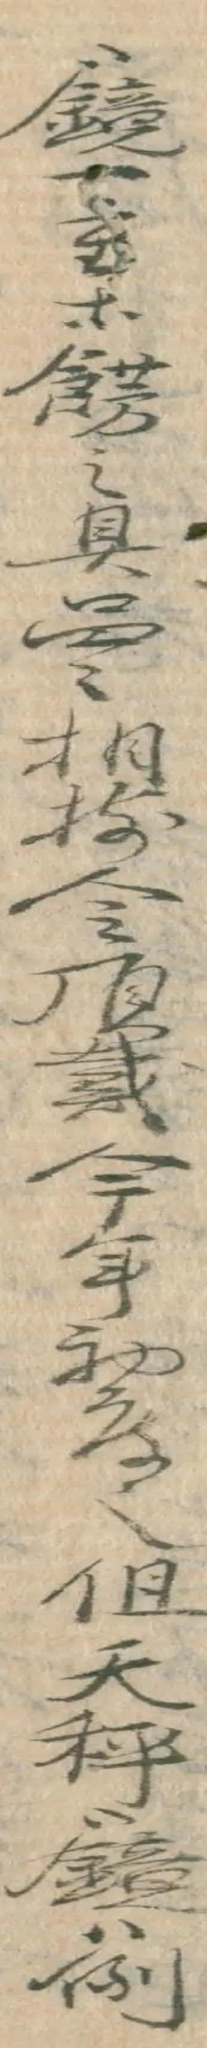御鏡等餝之具品々相揃令頂戴今年初度也但天秤御鏡御例
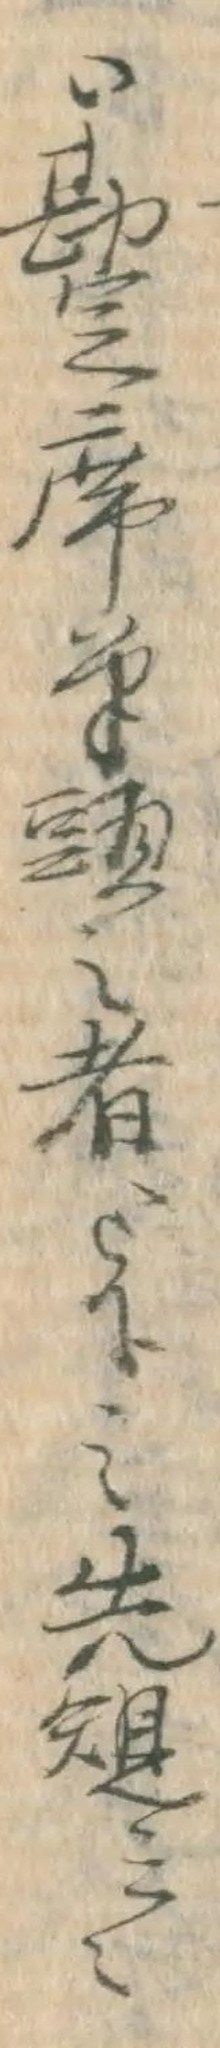御勘定席筆頭之者へ被下之先規云々

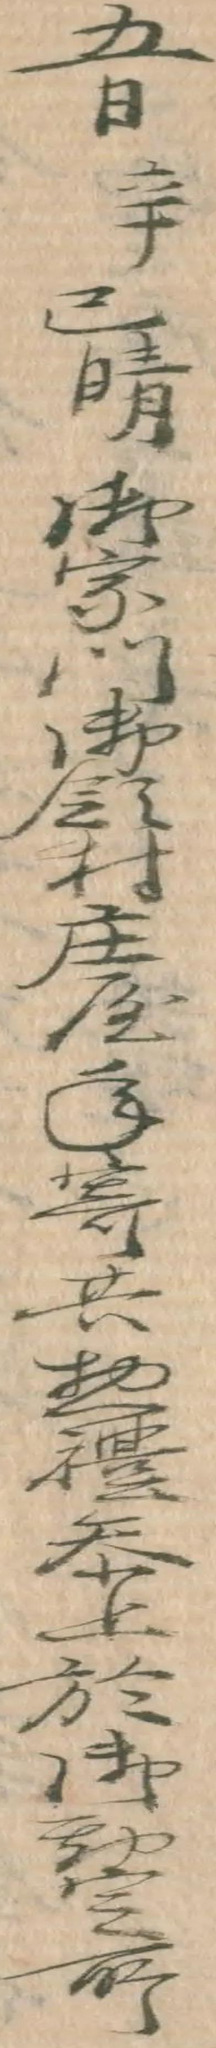五日辛巳晴御家門御領村庄屋年寄共惣禮参上於御勘定所
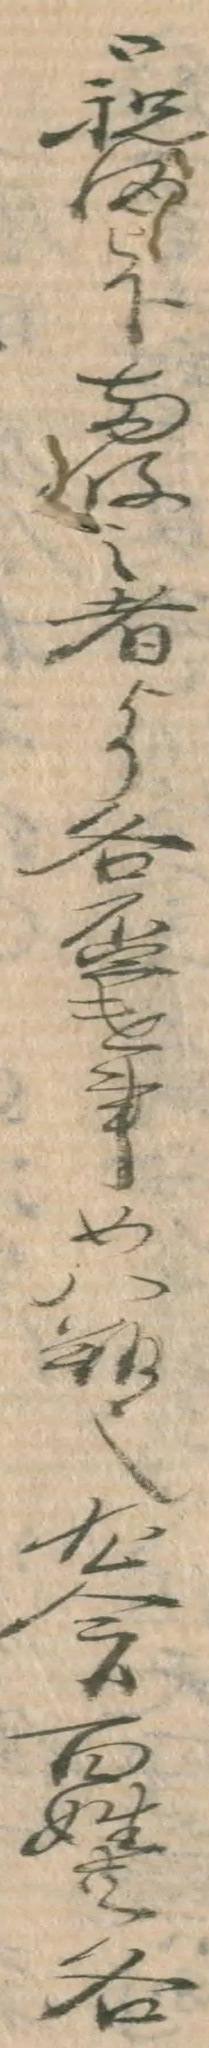御祝儀被下両役之者より各盃遣事如八朔也尤今日百姓共各
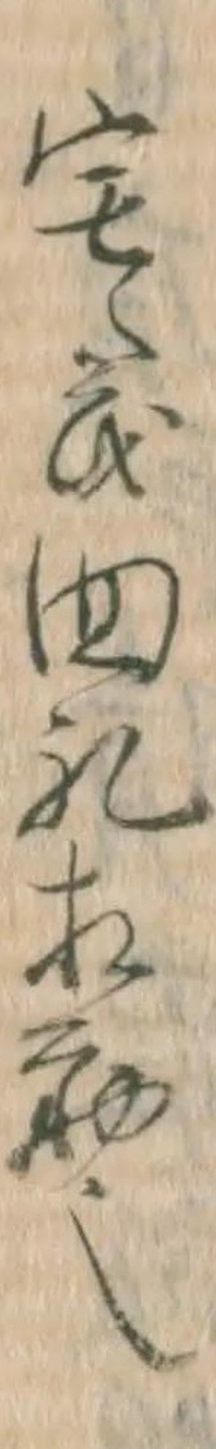宅へも回礼相勤之
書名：賀茂社記録. 第65冊
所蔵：国立国会図書館 National Diet Library, JAPAN
